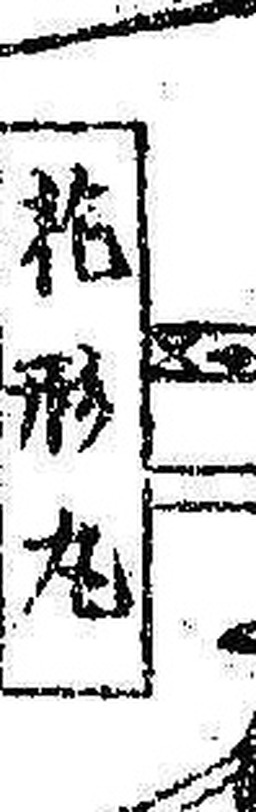花形丸
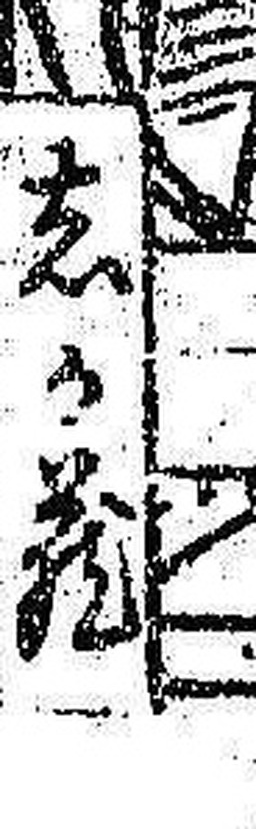しか蔵
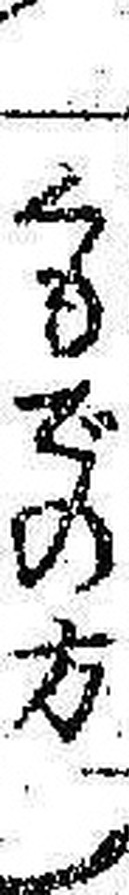くもでの方

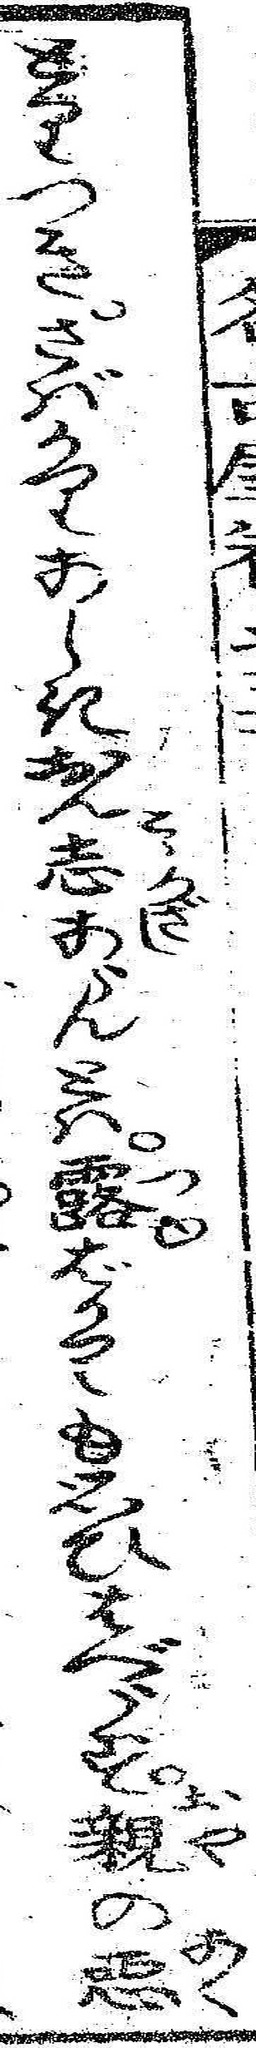とりつき。さばかりあしきおん志あらんとは。露ばかりも思ひはべらず。親の悪
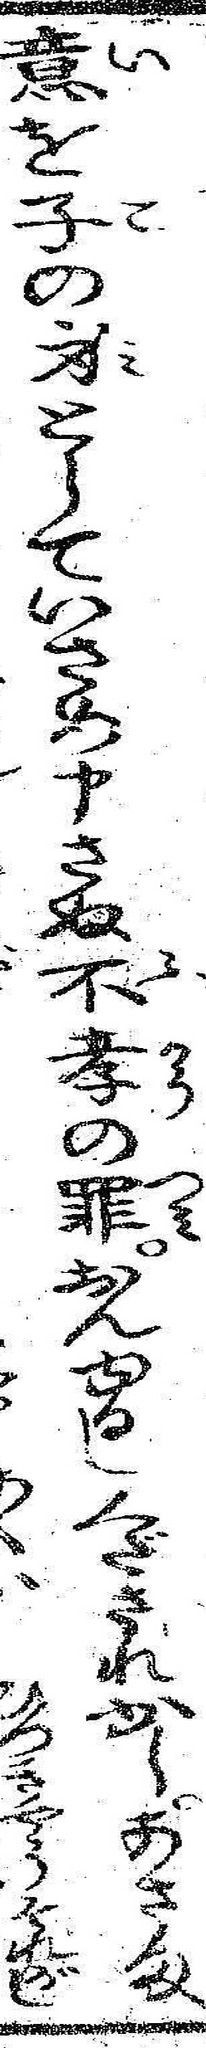意を子の身としていさめ申さぬ不孝の罪。おんゆるしくだされかし。あさま
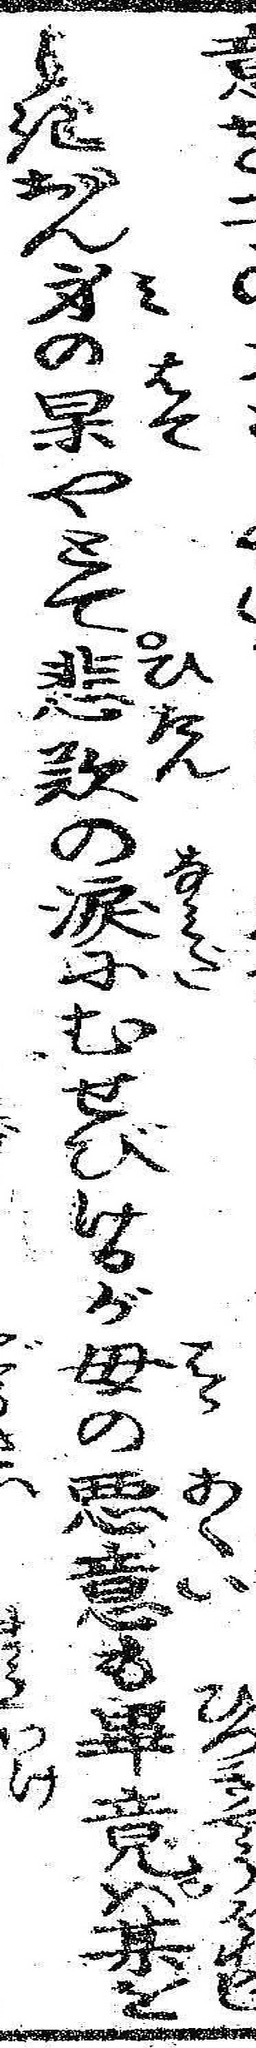しきおん身の果やとて。悲歎の涙にむせびけるが母の悪意も畢竟は。某を
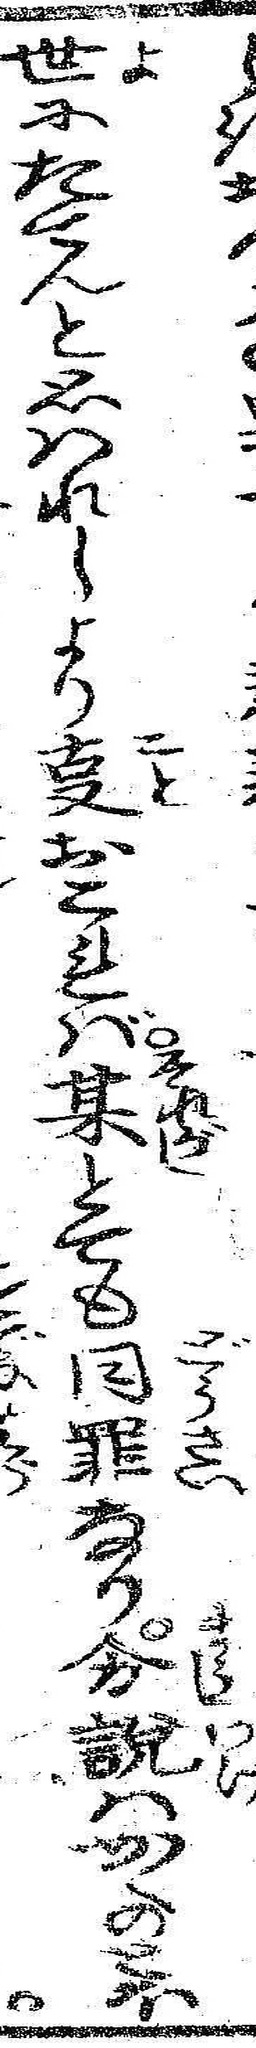世にたてんと思はれしより事おこれば。某とても同罪なり。分説はかくのとほ
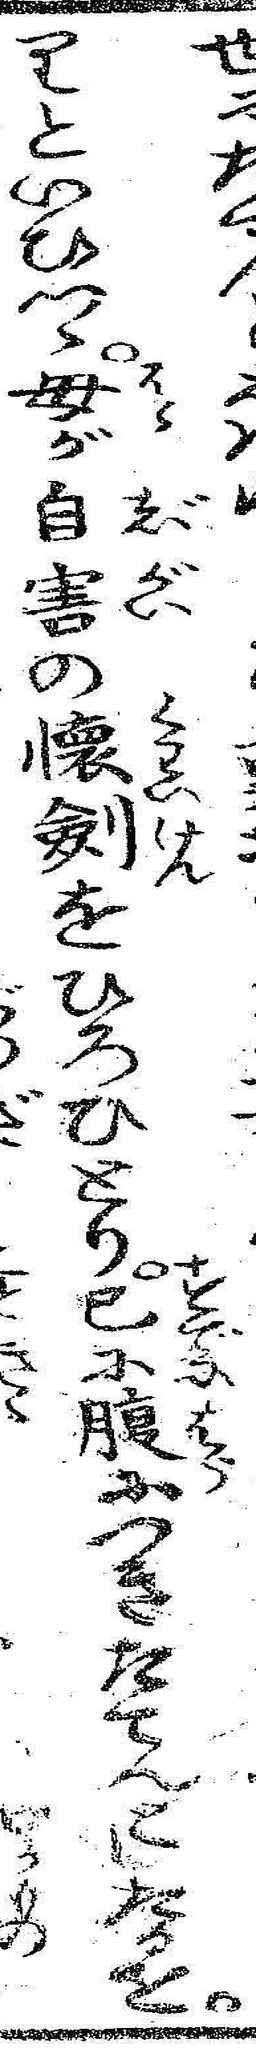りといひつゝ。母が自害の懐剣をひろひとり。已に腹につきたてんとしたるを。
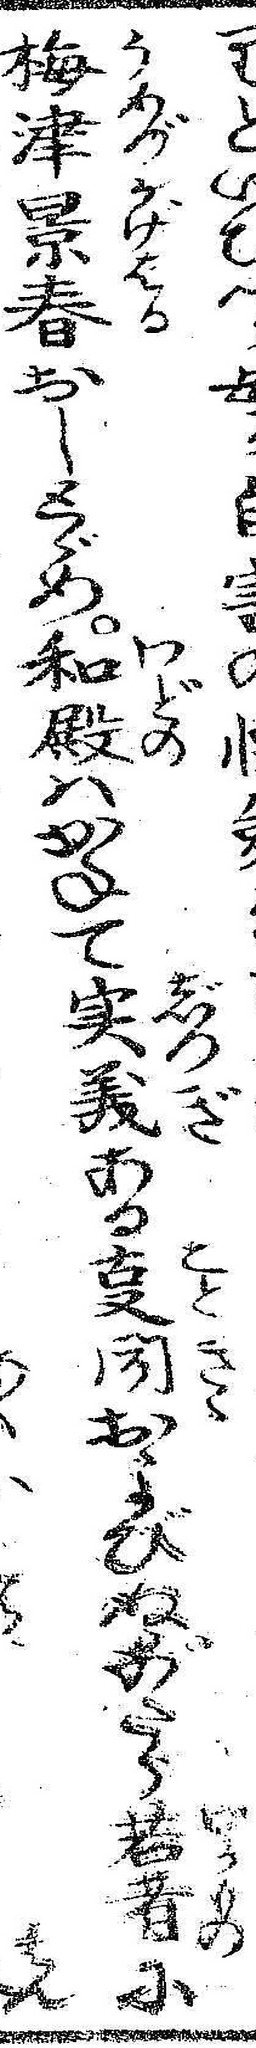梅津景春おしとゞめ。和殿はかねて実義ある事聞およびぬ。あたら若者に
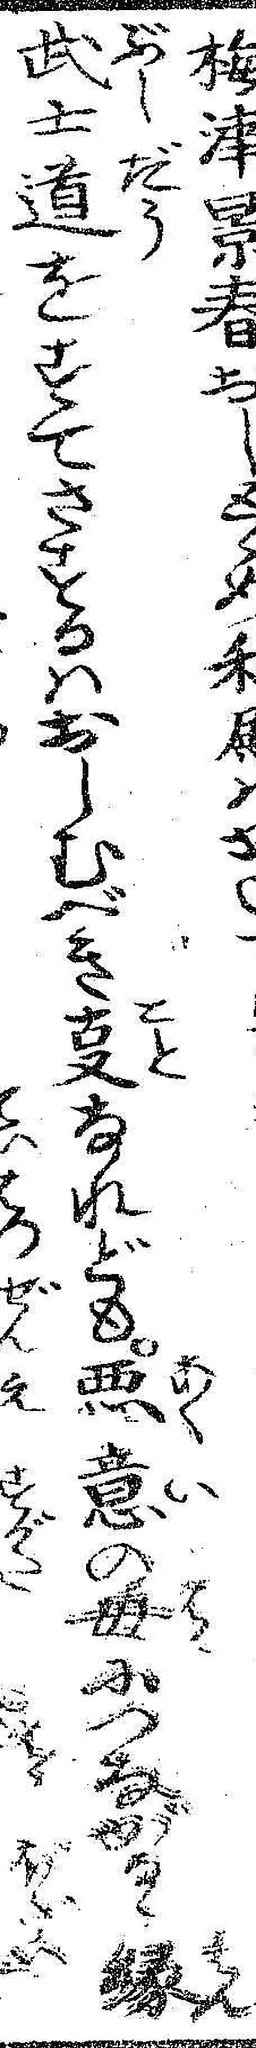武士道をすてさするはおしむべき事なれども。悪意の母につながるゝ縁
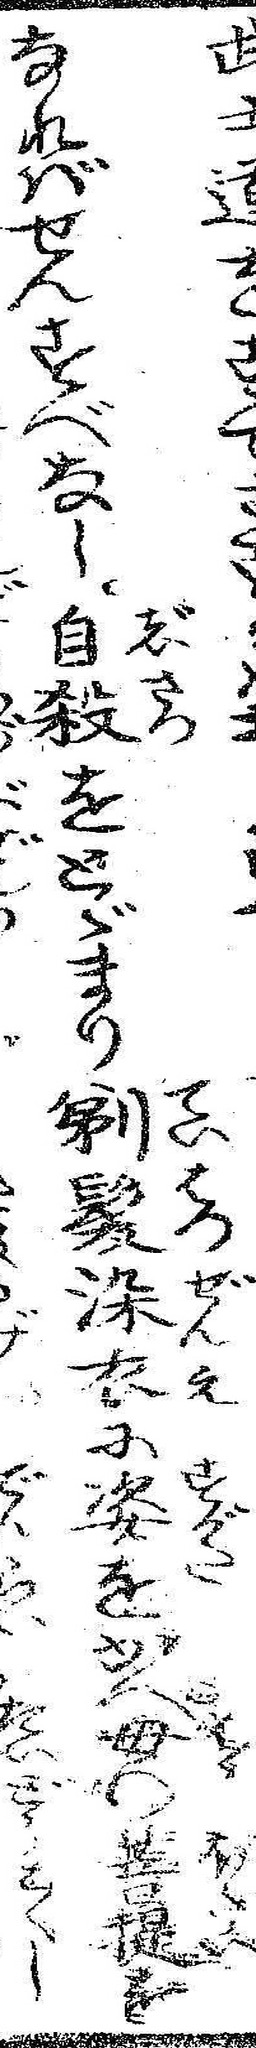なればせんすべなし。自殺をとゞまり剃髪染衣に姿をかへ。母の菩提を
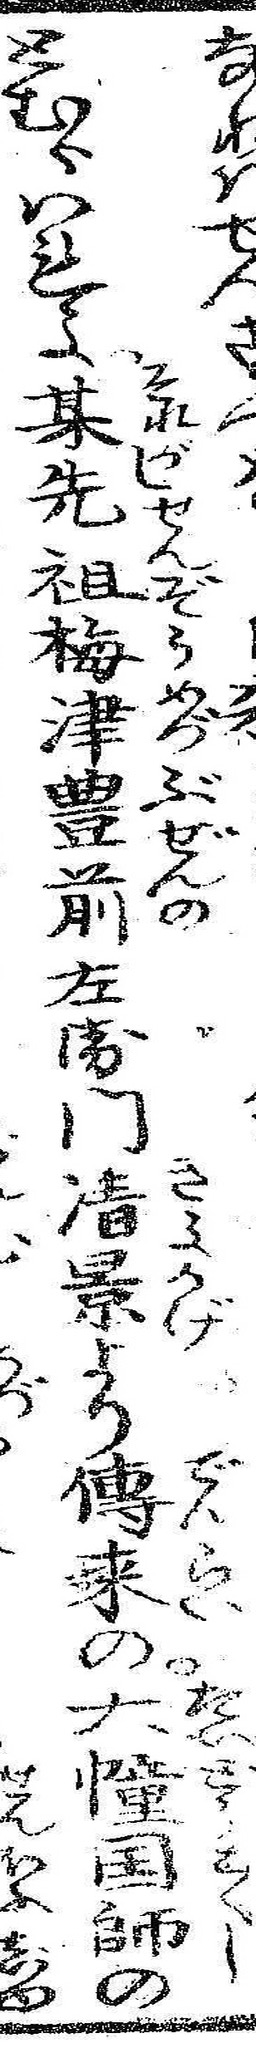とむらはれよ。某先祖梅津豊前左衛門清景より伝来の。大幢国師の
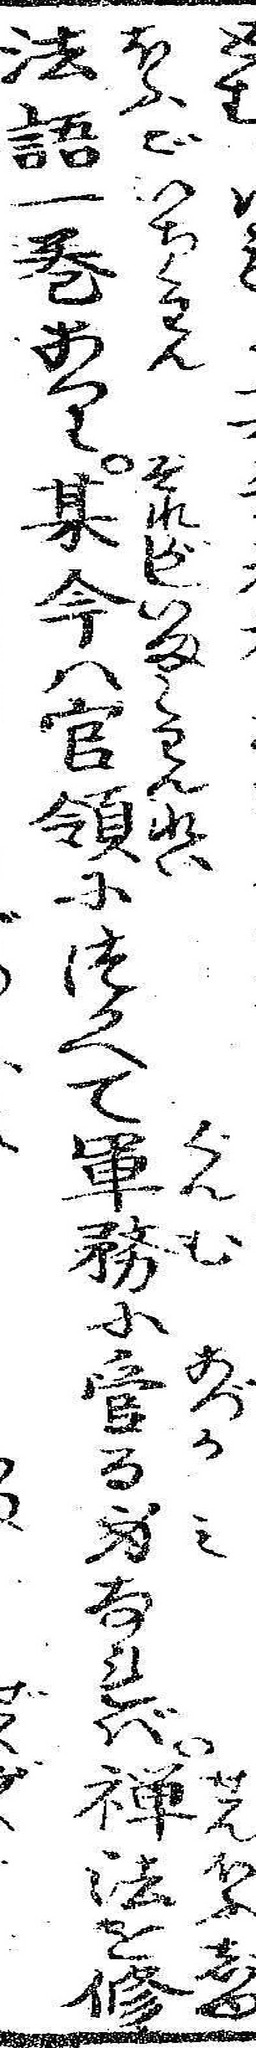法語一巻あり。某今は官領につかへて軍務に管る身なれば。禅法を修
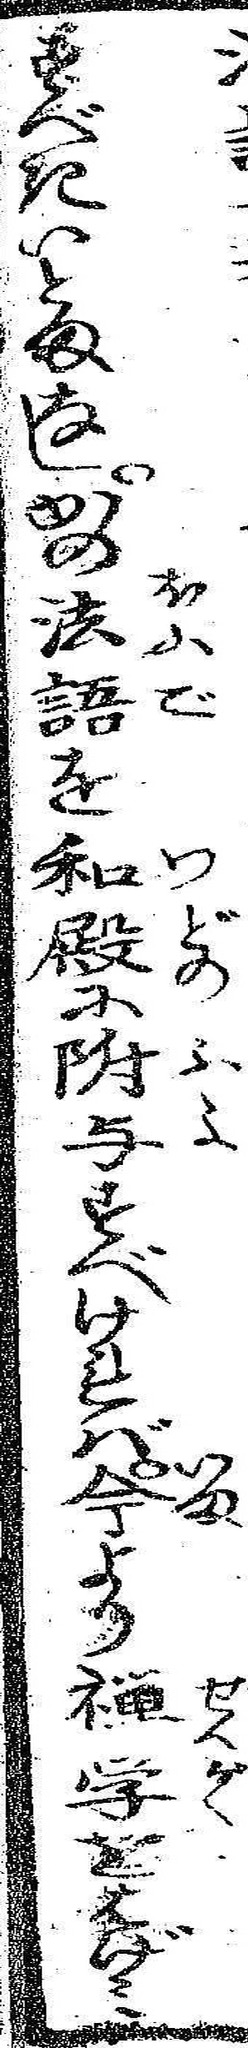すべきいとまなし。かの法語を和殿に附与すべければ。今より禅学をはげみ
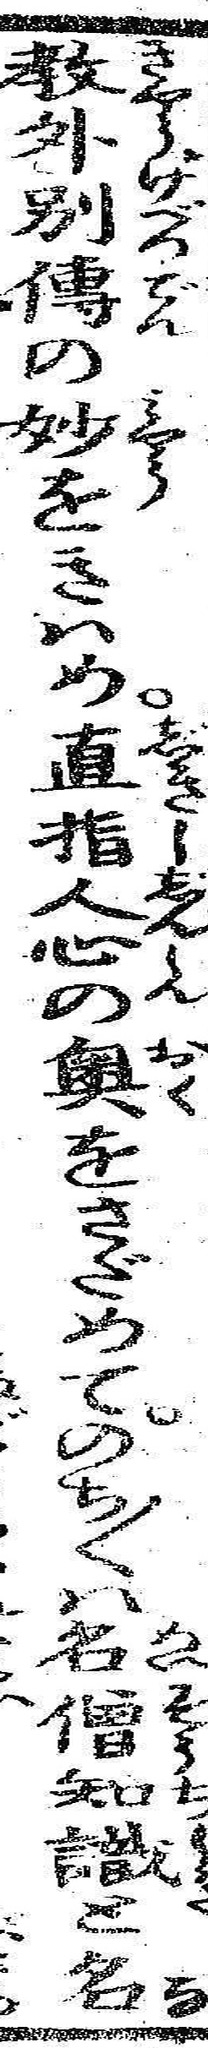教外別伝の妙をきはめ。直指人心の奥をさだめて。のち〳〵は名僧知識と名
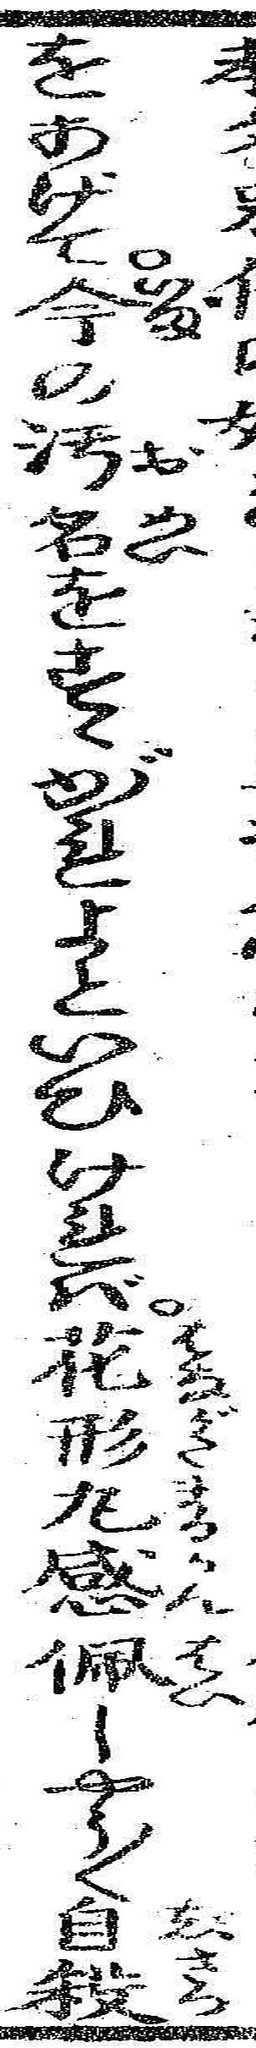をあげて。今の汚名をすゝがれよといひければ。花形丸感佩しやう〳〵自殺
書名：昔話稲妻表紙
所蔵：国文学研究資料館
